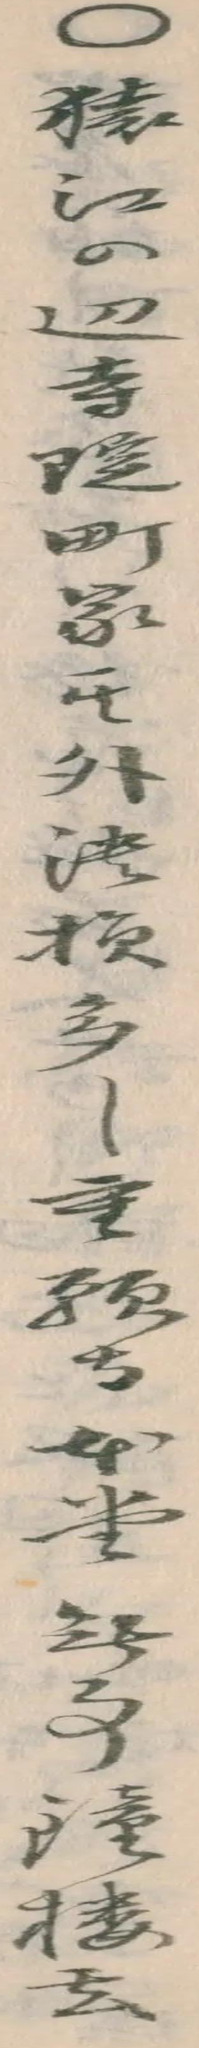○猿江の辺寺院町家其外潰損多し重願寺本堂無事鐘楼玄
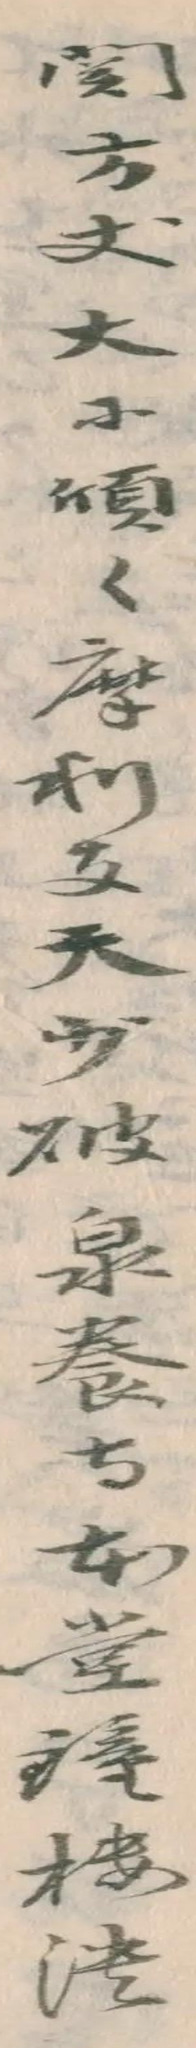関方丈大に傾く摩利支天少破泉養寺本堂鐘楼潰
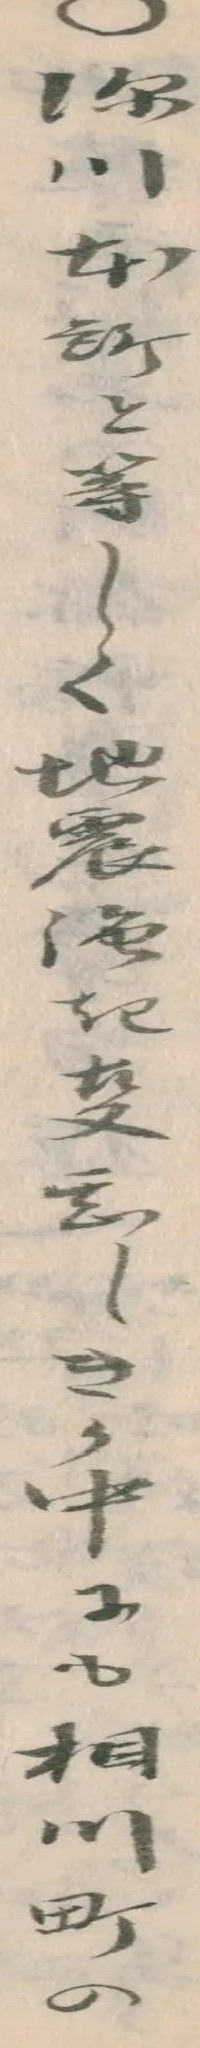○深川本所と等しく地震強き事甚しきか中にも相川町の
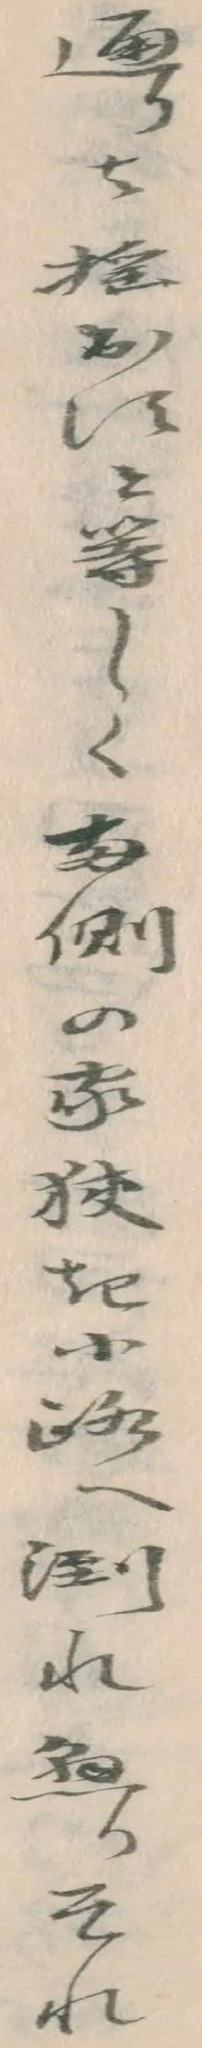通りは揺出すと等しく両側の家狭き小路へ倒れ懸りそれ
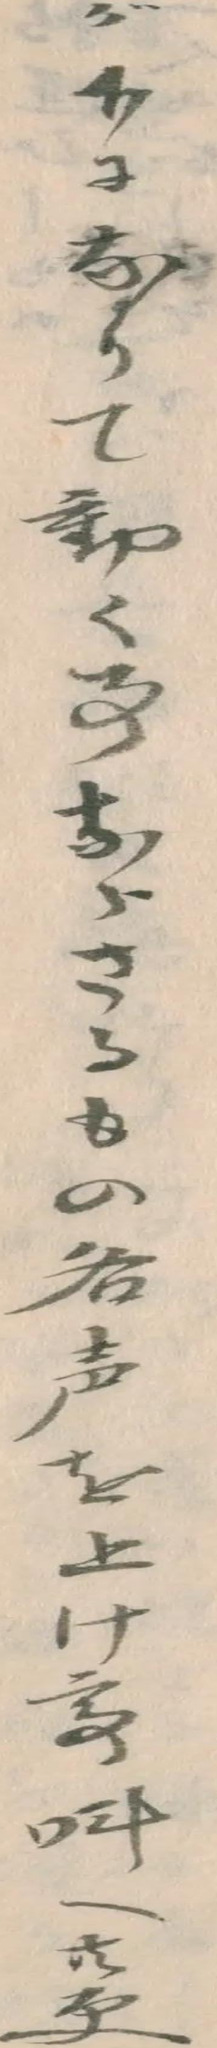か下になりて動く事ならさるもの各声を上けて叫へ共更
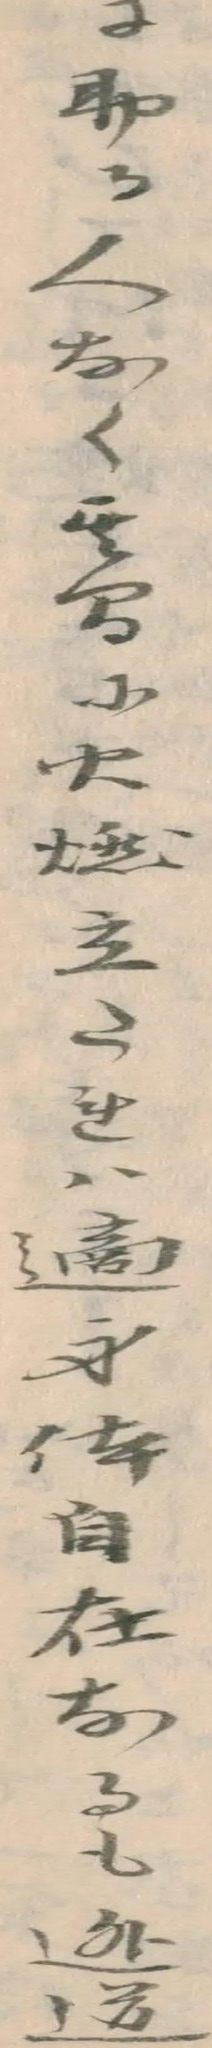に助る人なく其間に火燃立たれは適身体自在なるも逃道

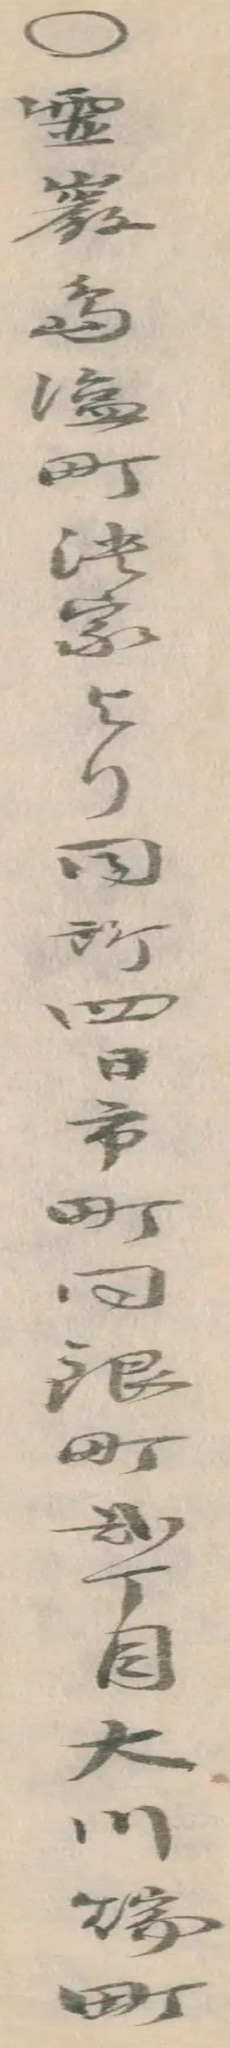〇霊巖島塩町潰家より同所四日市町同銀町弐丁目大川端町
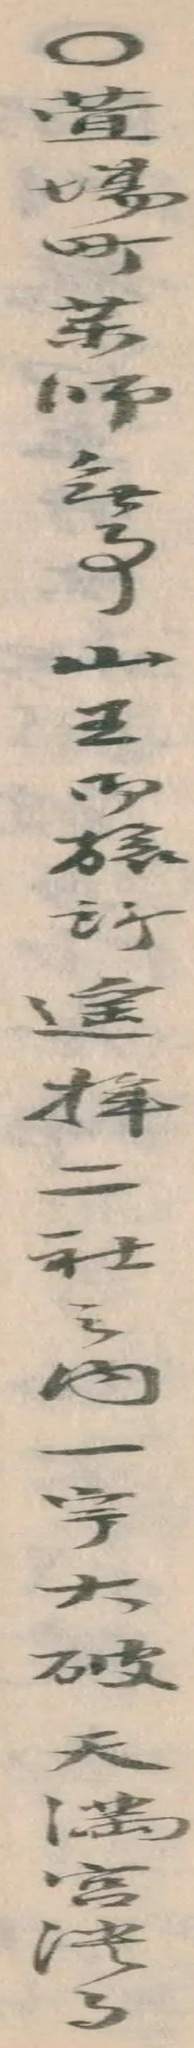〇萱場町薬師無事山王御旅所遥拝二社之内一宇大破天満宮潰る
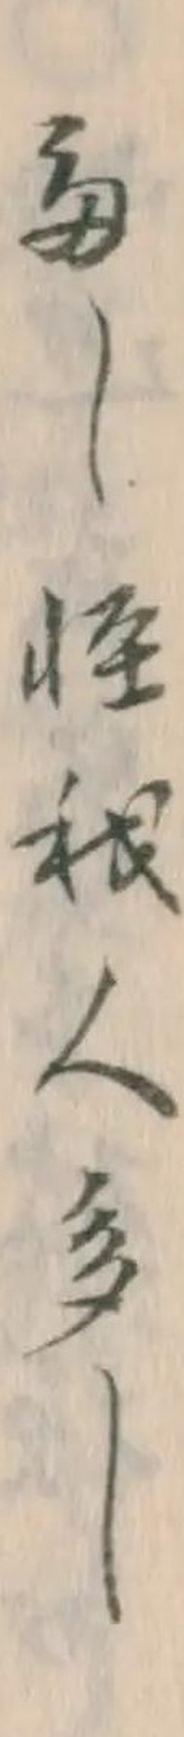多し怪我人多し
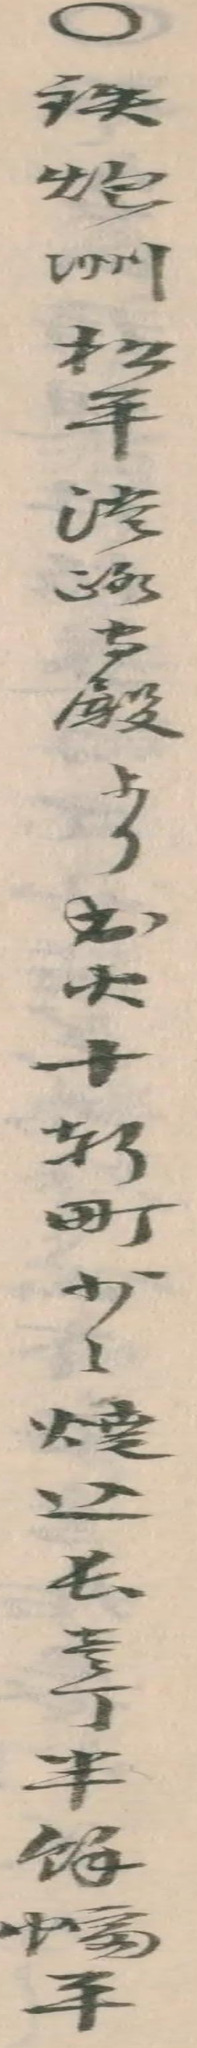〇鉄炮州松平淡路守殿より出火十軒町少し焼込長壱丁半余巾平
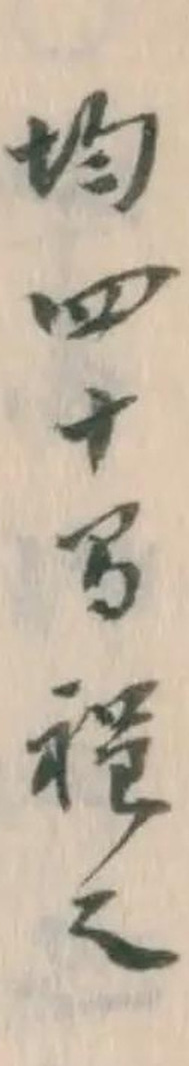均四十間程也
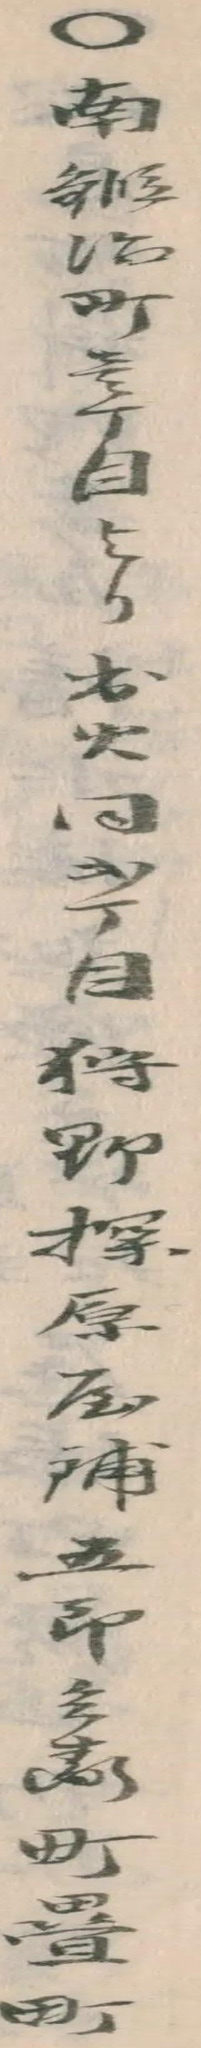〇南鍛冶町壱丁目より出火同弐丁目狩野探原屋鋪五郎兵衛町畳町
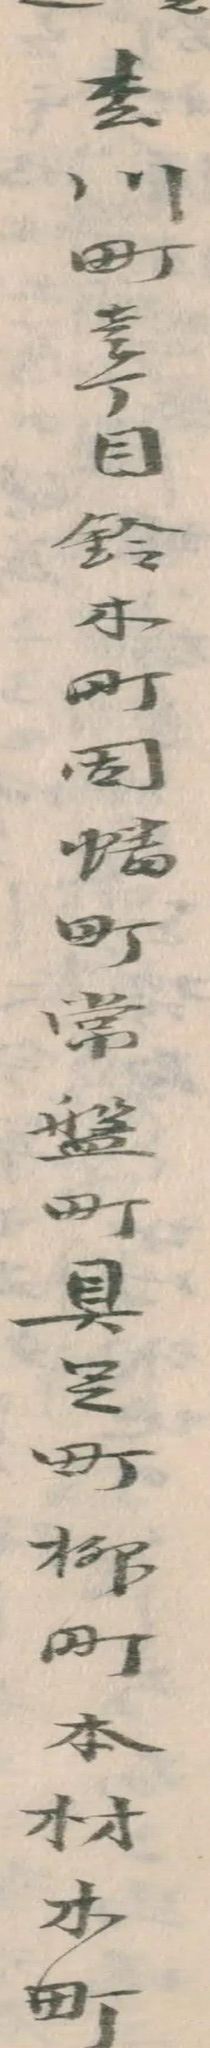焼込松川町壱丁目鈴木町因幡町常盤町具足町柳町本材木町
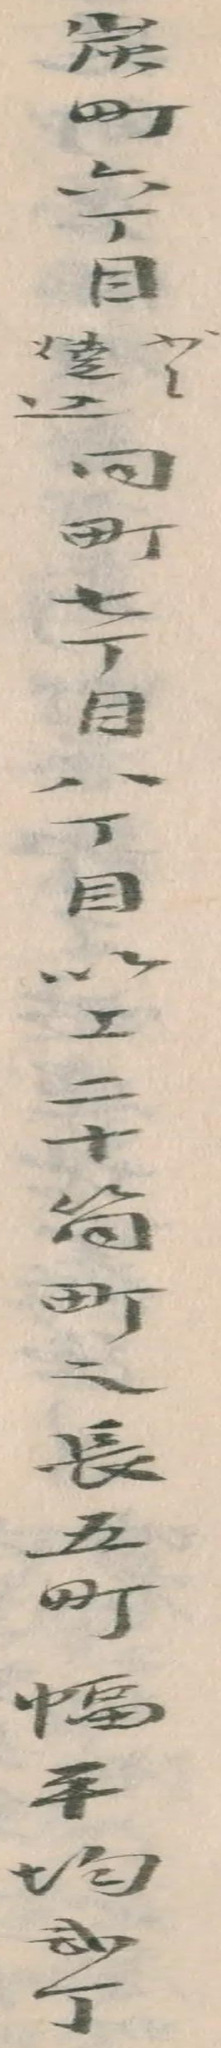炭町六丁目少し焼込同町七丁目八丁目以上二十箇町也長五町巾平均弐丁

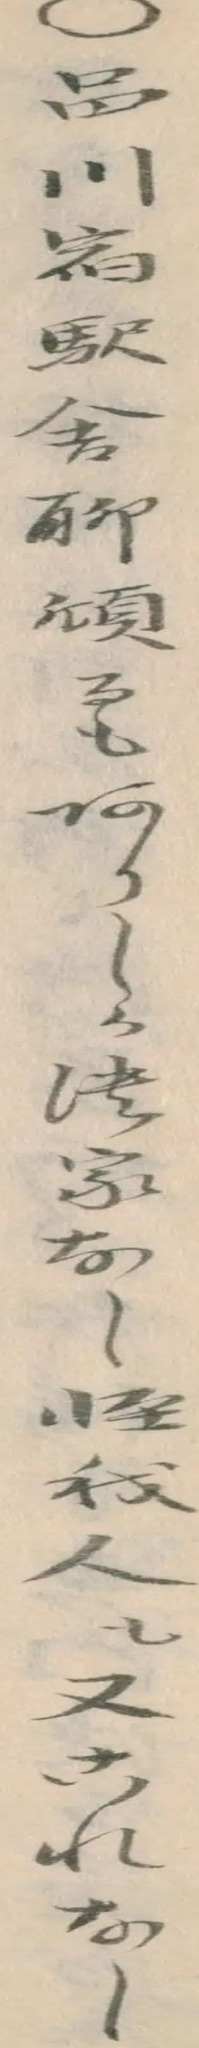〇品川宿駅舎聊傾るもありしか潰家なし怪我人も又これなし
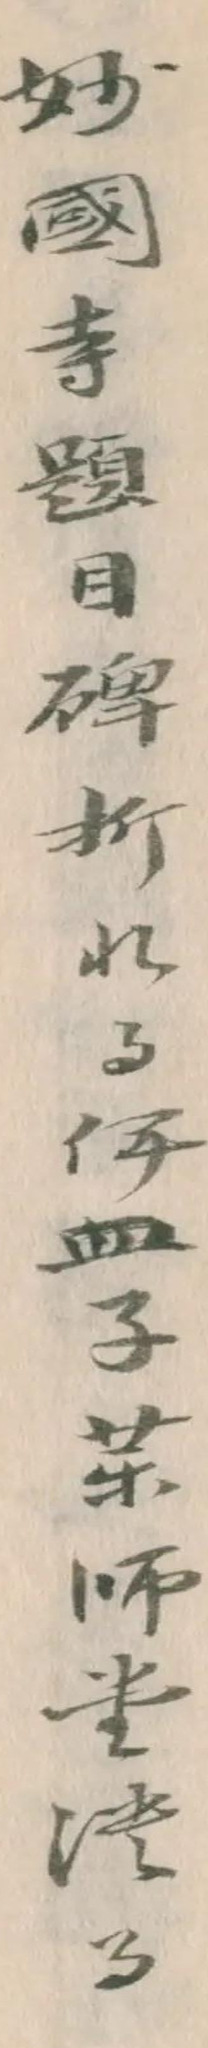妙国寺題目碑折れる伊皿子薬師堂潰る
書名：地災撮要. 巻7-9(地震之部)
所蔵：国立国会図書館 National Diet Library, JAPAN
